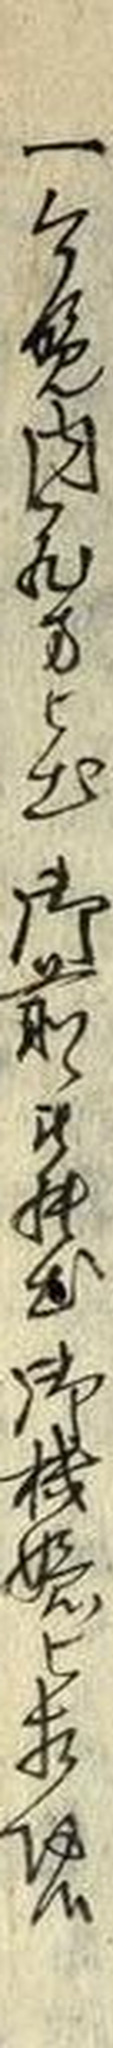一今晩内蔵方被出御前へ被罷出御機嫌被相伺候
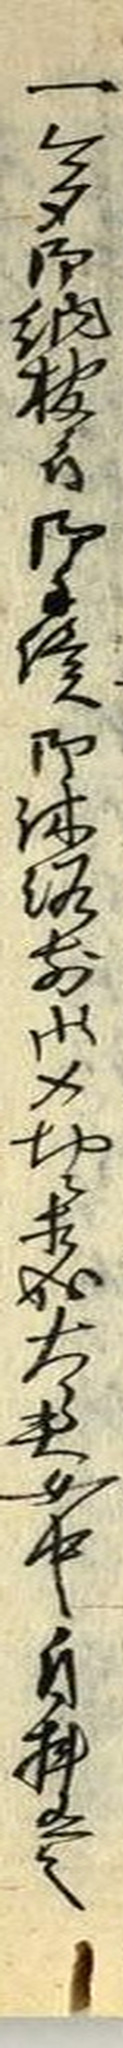一今夕御納棺ニ付御手続御沐浴前御〆切ニ相成大奥女中自拝有之
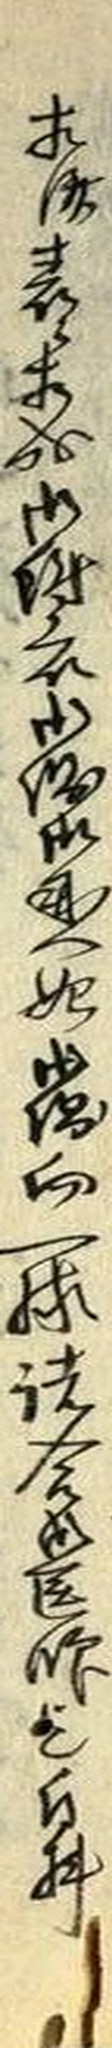相済表へ相成御附衆御側御用人始御側向一統詰合御医師迄自拝
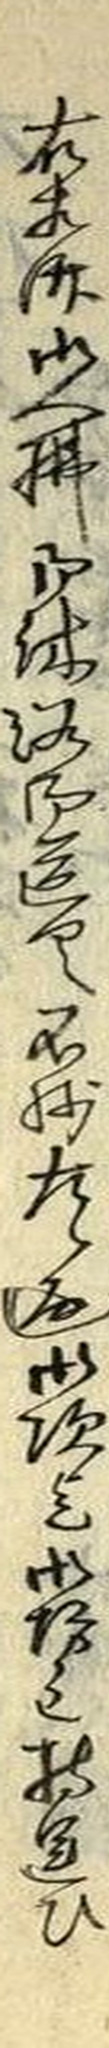右相済御人払御沐浴御道具不残左之通御次迄御坊主持運ひ
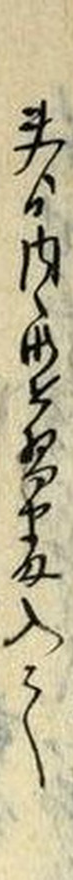夫ゟ内々御近習番入之
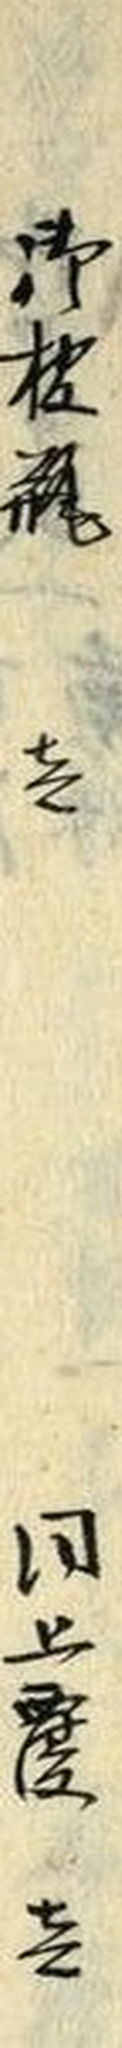御棺瓶壱同上覆壱
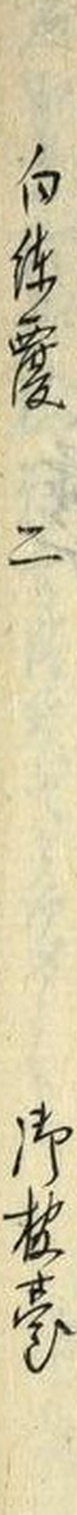白練覆二御棺台
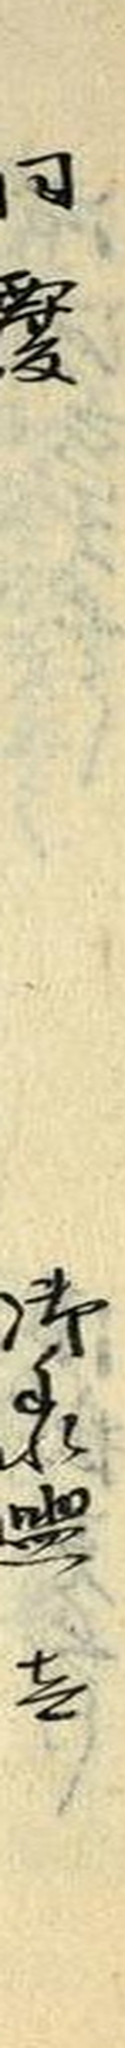同覆御手水盥壱
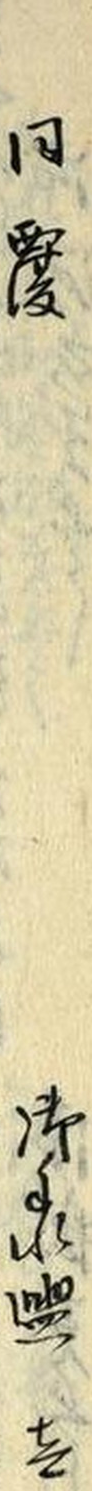同覆御手水盥壱
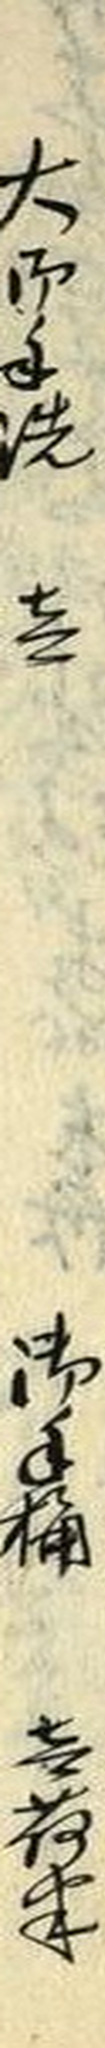大御手洗壱御手桶壱荷半
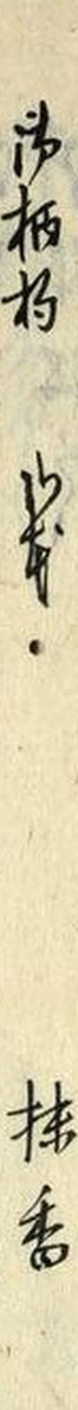御柄杓弐本抹香
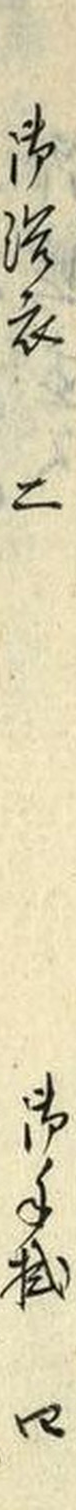御浴衣二御手拭四
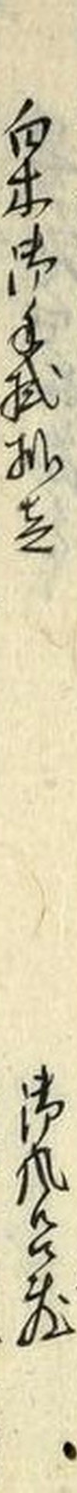白木御手拭掛壱御風呂敷
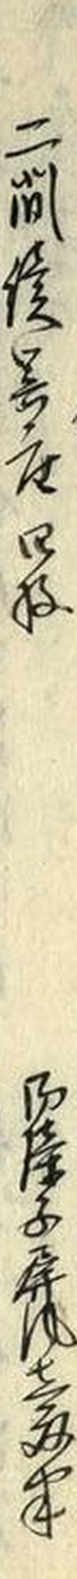二間続呉座四枚御障子屏風壱双半
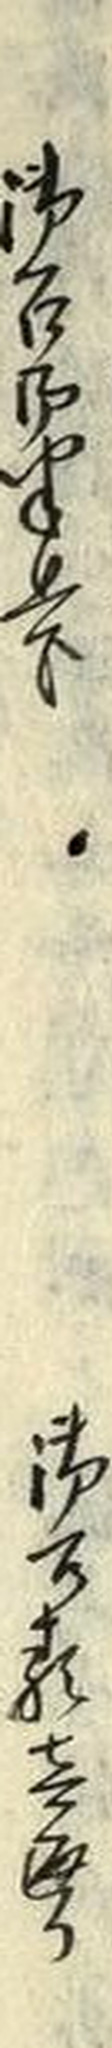御召御半上下御召類壱通り
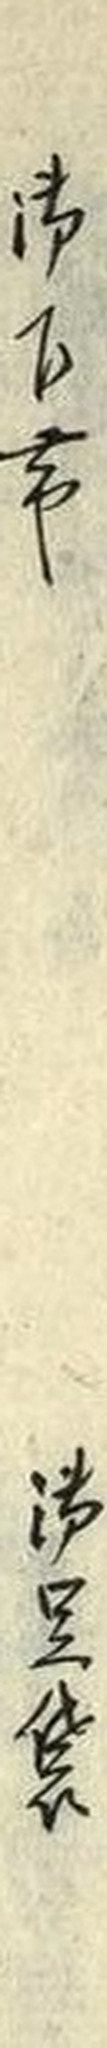御下帯御足袋
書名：少傅日録抄（斉善付側向頭取日記、江戸并道中、初入在国、逝去後…
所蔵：福井県文書館 Fukui Prefectural Archives
